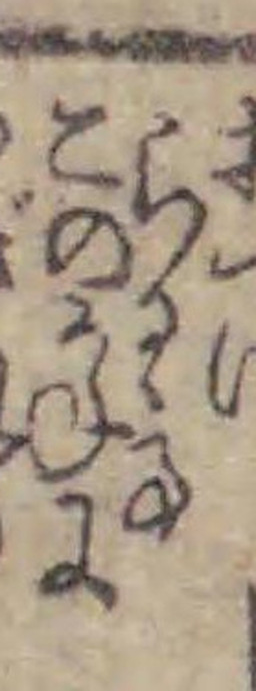このかねに
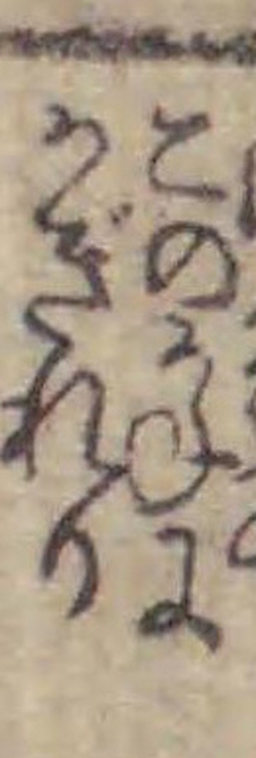かぎれり
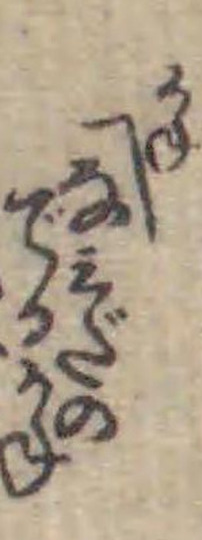〽なみだの
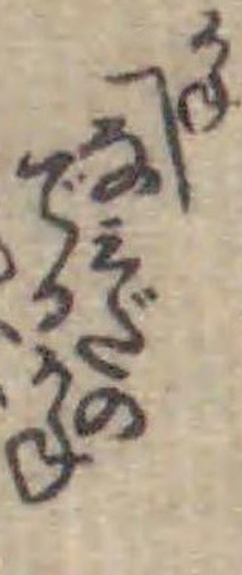〽なみだの
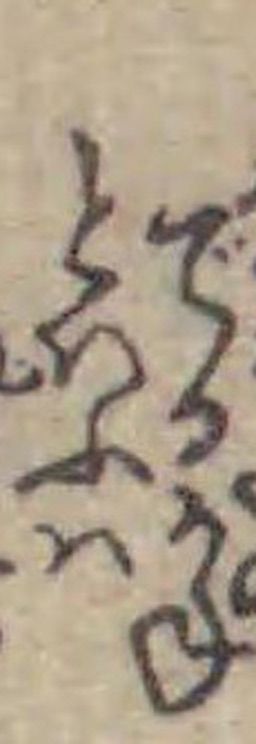といふは
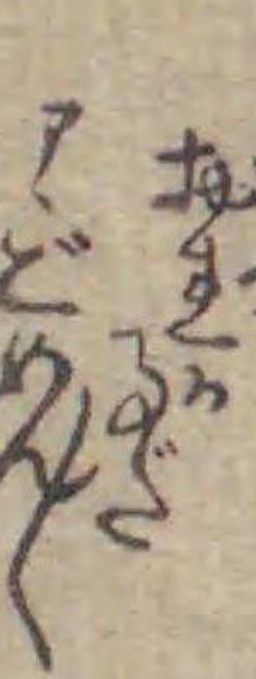アヽごめん〳〵
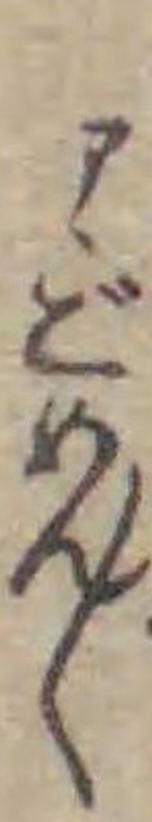アヽごめん〳〵
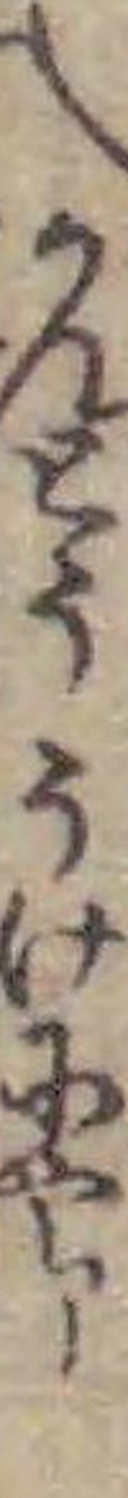かんどううけにやァ
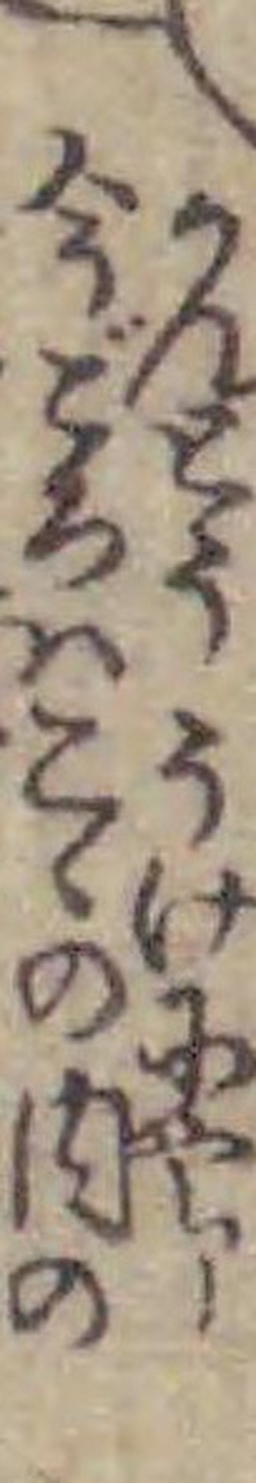今ごろはこゝの内の
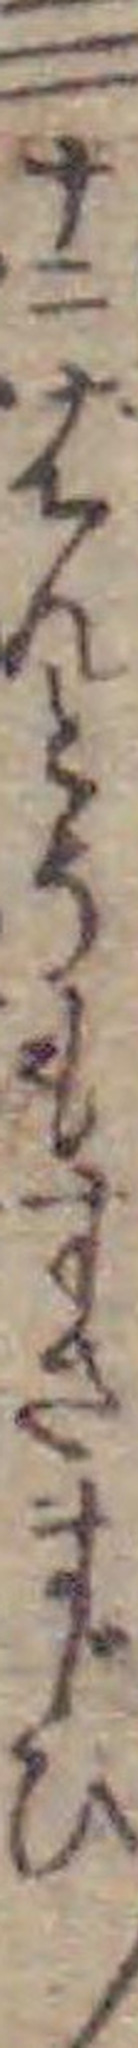ナニばんとうもすさまじひ
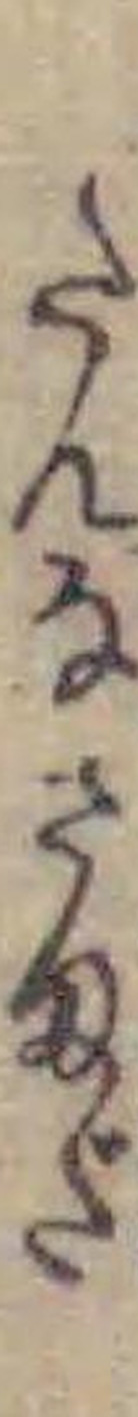たんなさまだ
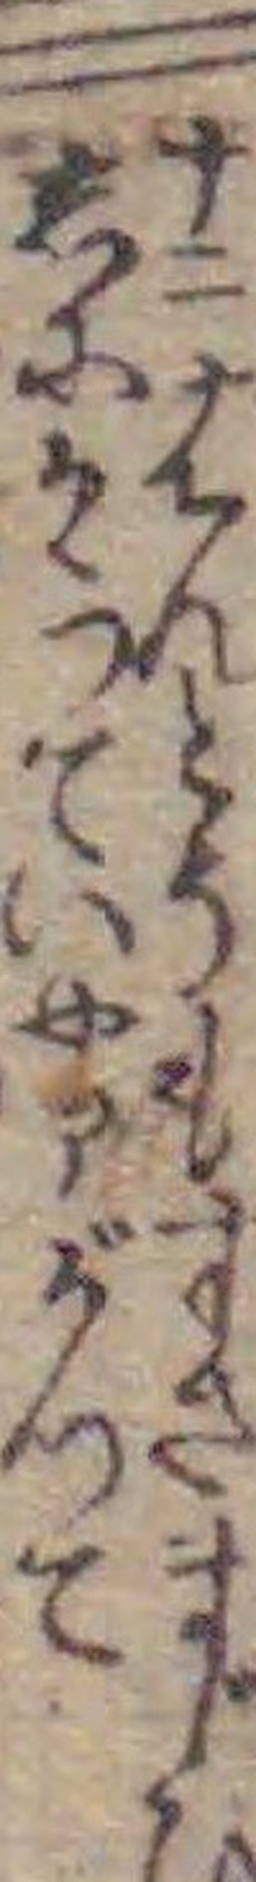しにかゝつていやァがつて
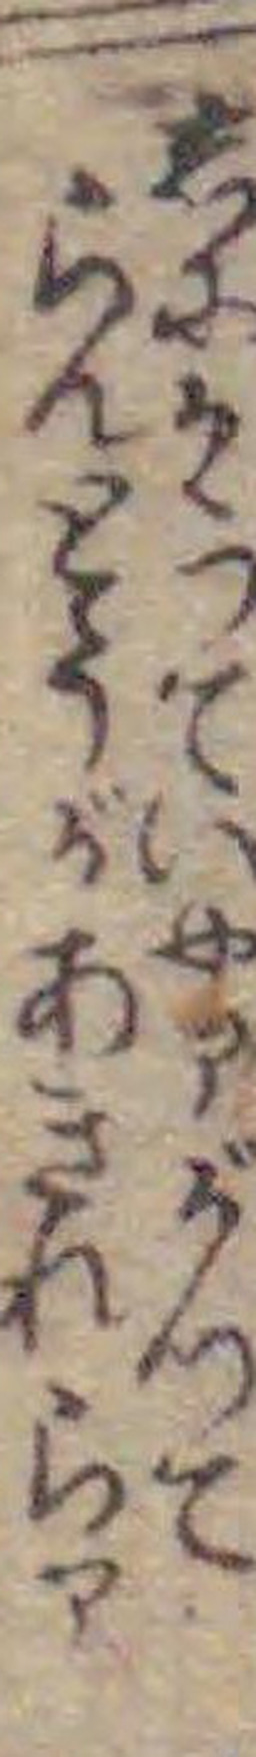らんとうがあきれらァ

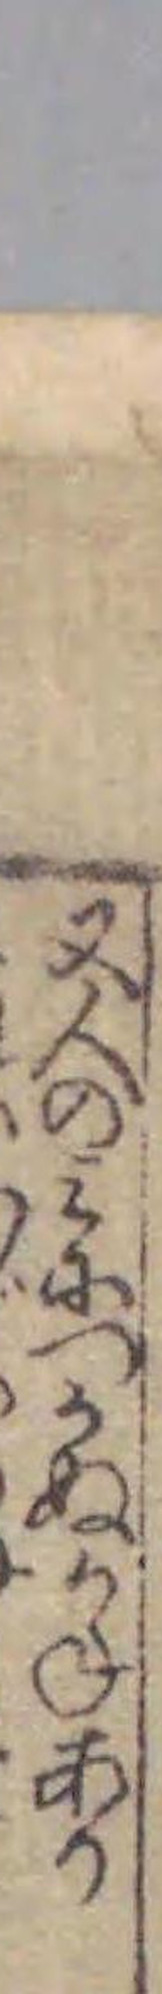又人のみにつかぬかねあり
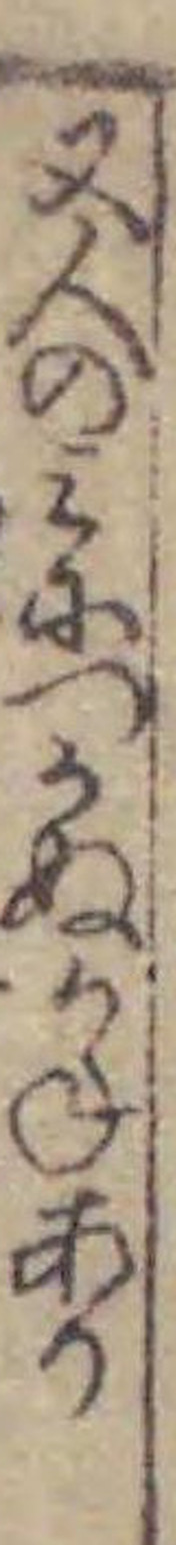又人のみにつかぬかねあり
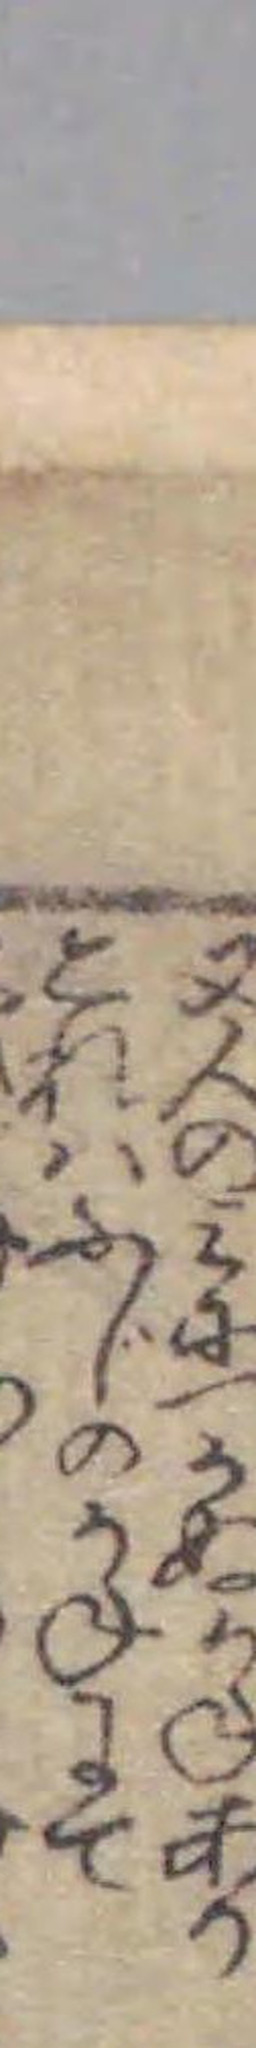これはふじのかねにて
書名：新鋳小判 : 3巻
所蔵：国立国会図書館 National Diet Library, JAPAN
